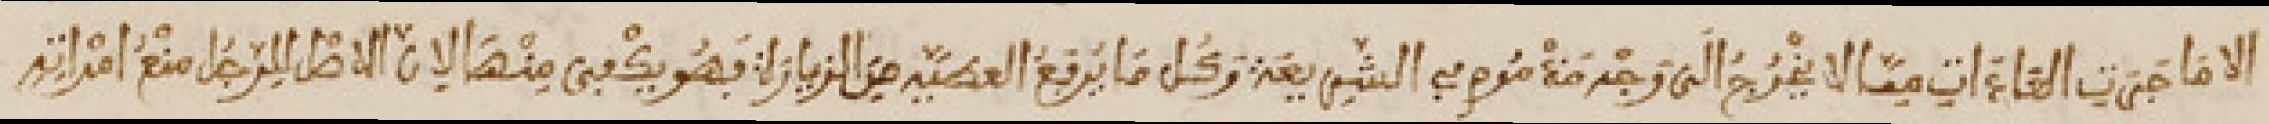الا ما جرت به العادات مما لا يخرج الى وجه مذموم في الشريعة وكل ما يرفع العطية من الزيارة فهو يكفي منها لان الاصل للرجل منع امراته
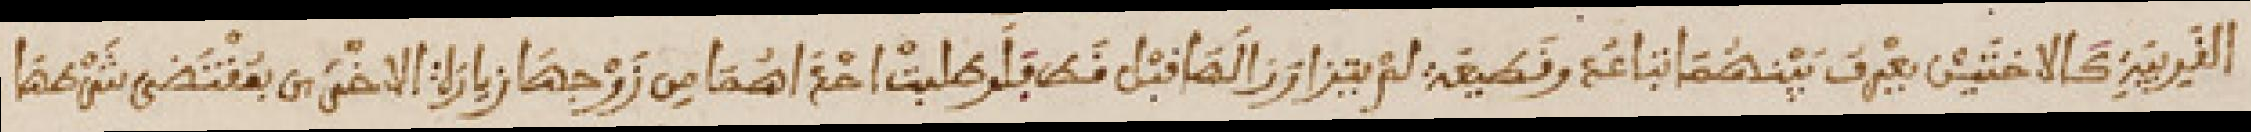القريبة كالاختين يعرف بينهما تباعد وقطيعة لم يتزاورا لها قبل قط فلو طلبت احداهما من زوجها زيارة الاخرى بمقتضى شرطها
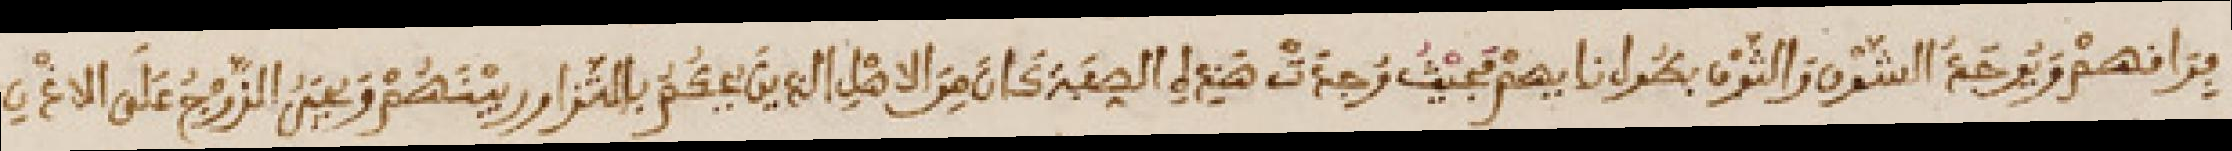فراقهم ويوجد الشوق والثوق بطول نايهم فحيث وجدت هذه الصفة كان من الاهل الذين يحكم بالتزاور بينهم ويجبر الزوج على الاذن
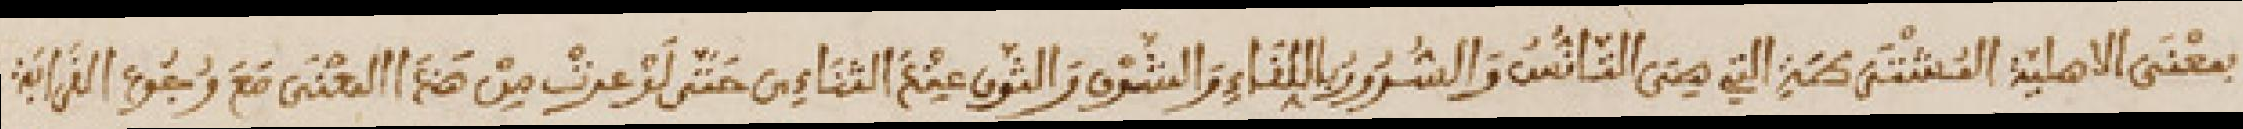بمعنى الاهلية المشترطة التي هي التانس والشرور باللقاء والشوق والثوق عند الثناءى حتى لو عرت من هذا المعنى مع وجود القرابة
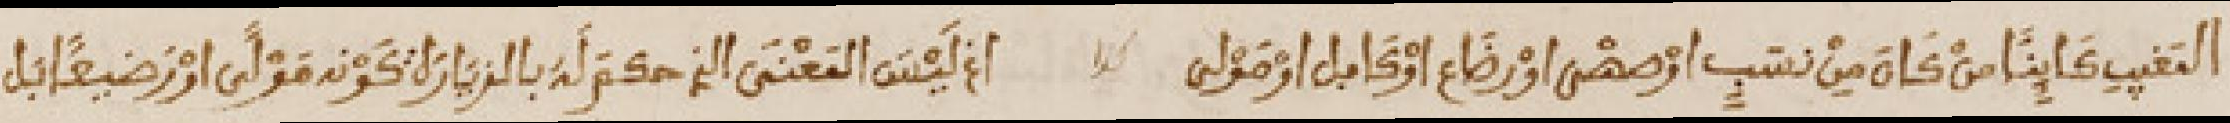المغيب كائنا من كان من نسب او صهر او رضاع او كافل او مولى كذا اذ ليس المعنى الذي حكم له بالزيارة كونه مولى او رضيعا بل
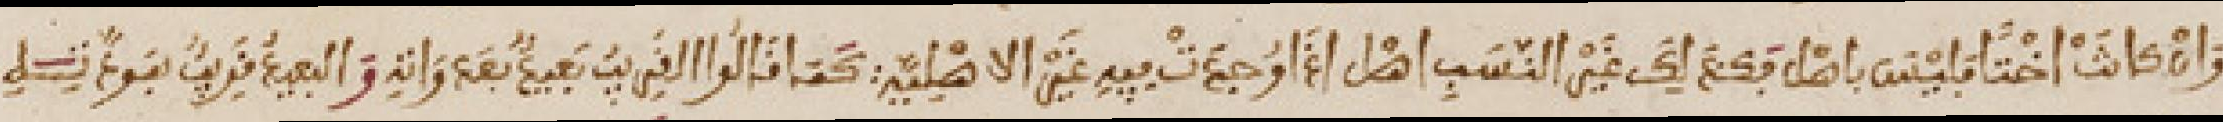وان كانت اختا فليس باهل فكذلك غير النسب اهل اذا وجدت فيه غير الاهلية كما قالوا القريب بعيد بعداوته والبعيد قريب بمودته
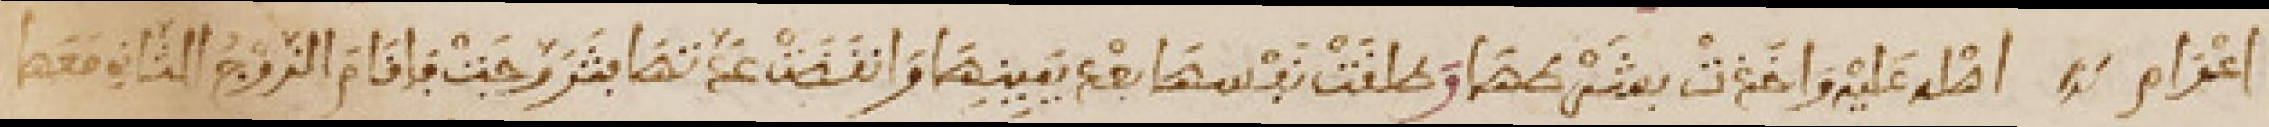اعوام كذا اهله عليه واخذت بشرطها وطلقت نفسها بعد يمينها وانقضت عدتها فتزوجت فاقام الزوج الثاني معها
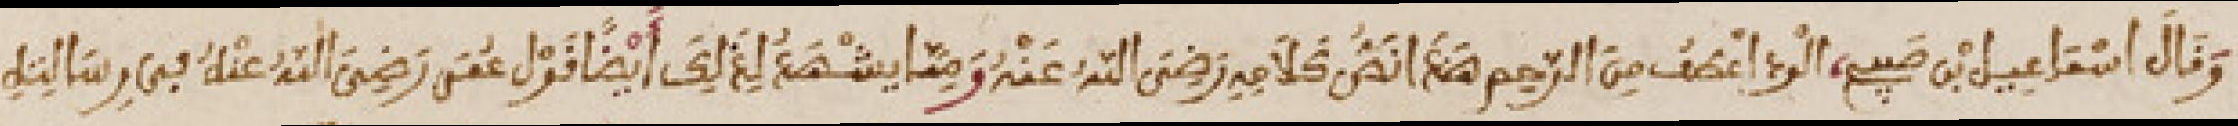و قال اسماعيل بن صبيح الود اعطف من الرحم هذا نص كلامه رضي الله عنه ومما يشهد لذلك أيضا قول عمر رضي الله عنه في رسالته
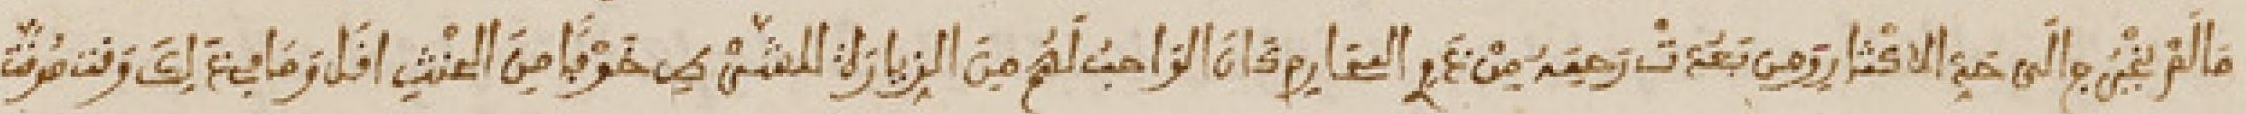ما لم يخرج الى حد الاكثار ومن بعدت رحمه من ذوي المحارم كان الواجب لهم من الزيارة للشرط خوفا من الحنث اقل وما في ذلك وقت موقت
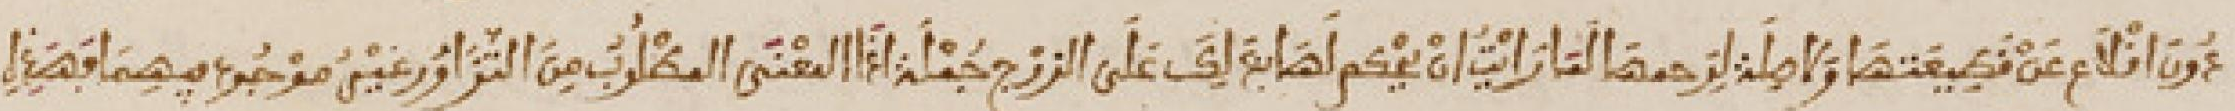دون اقلاع عن قطيعتها ولا صلة لرحمها لما رايت ان يحكم لها بذلك على الزوج جملة اذا المعنى المطلوب من التزاور غير موجود فيهما فهذه
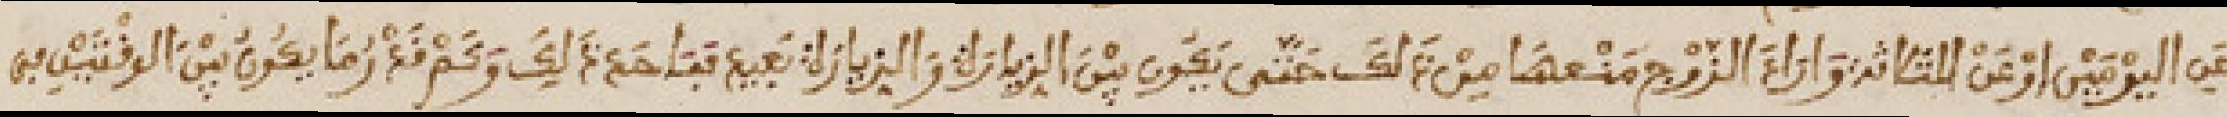عن اليومين او عن الثلاثة واراد الزوج منعها من ذلك حتى يكون بين الزيارة والزيارة بعيد فما حد ذلك وكم قدر ما يكون بين الوقتين في
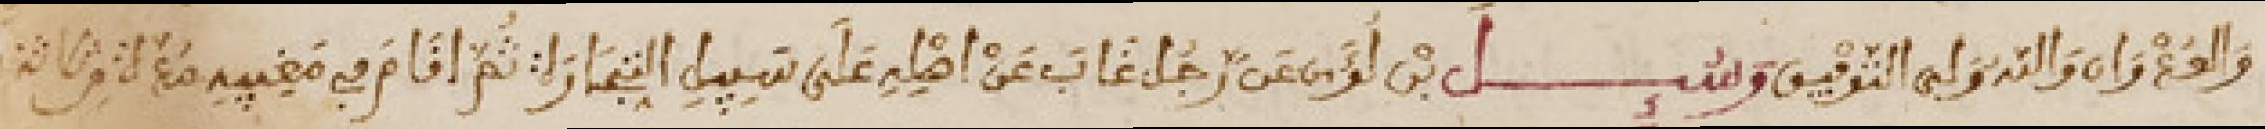والعدوان والله ولي التوفيق وسئل بن لؤي عن رجل غاب عن اهله على سبيل التجارة ثم اقام في مغيبة مدة من ثلاثة
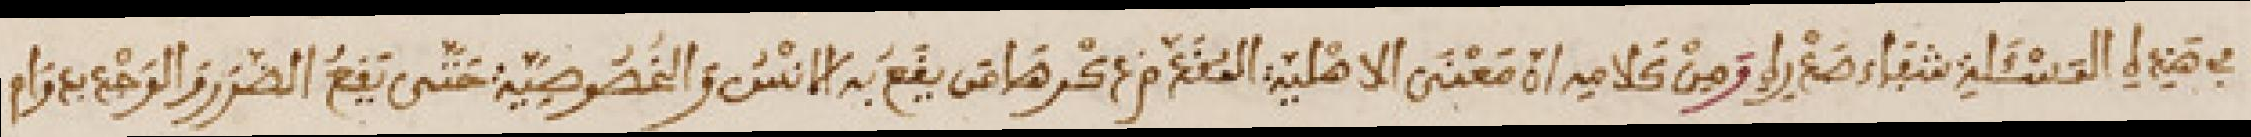في هذه المسئلة شفاء صدره ومن كلامه ان معنى الاهلية المقدم ذكرها من يقع به الانس والخصوصية حتى يقع الضرر والوجد بدوام
